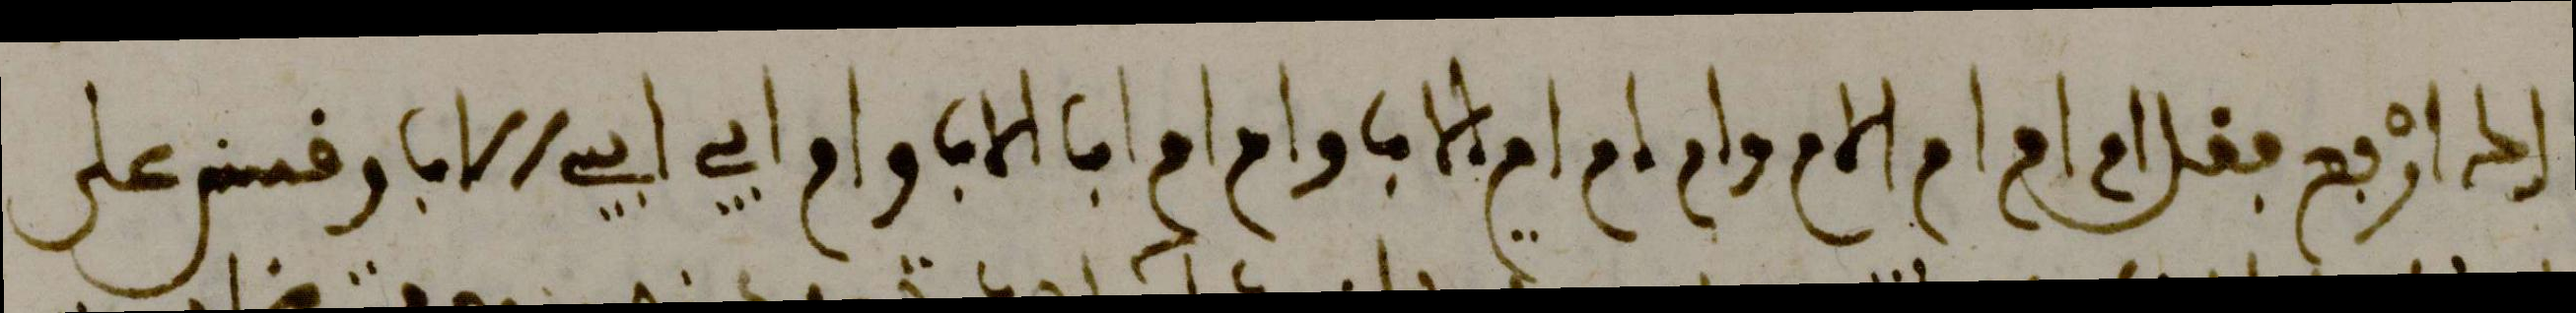لك ارْبع فقل ام ام ام الام وام ام ام الاب وام ام اب الاب وام ابي ابي الاب وقس على
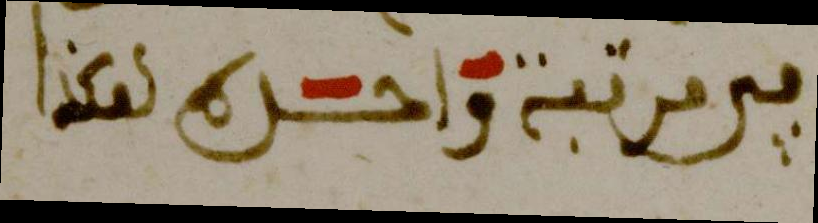في مرتبة واحدة هكذا
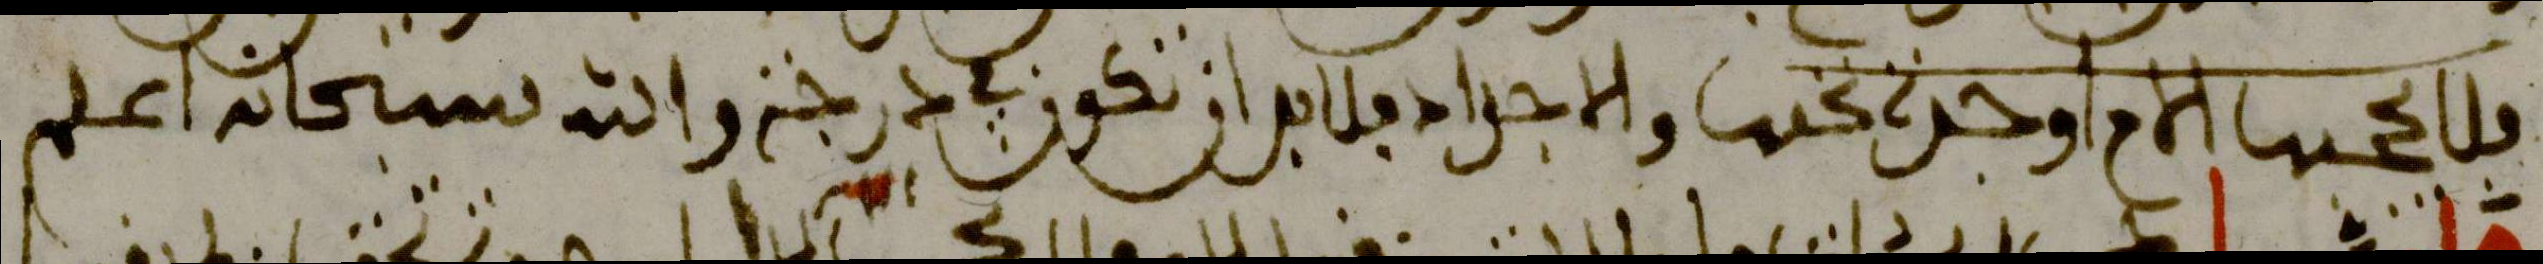فلا يحجبها الام او جدة تجتها والاجداد فلا بد ان تكون في درجة والله سبجانه اعلم
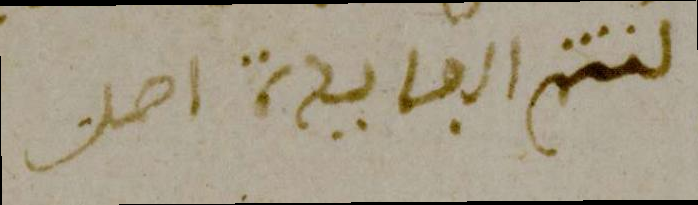لتتم الفايدة اصل
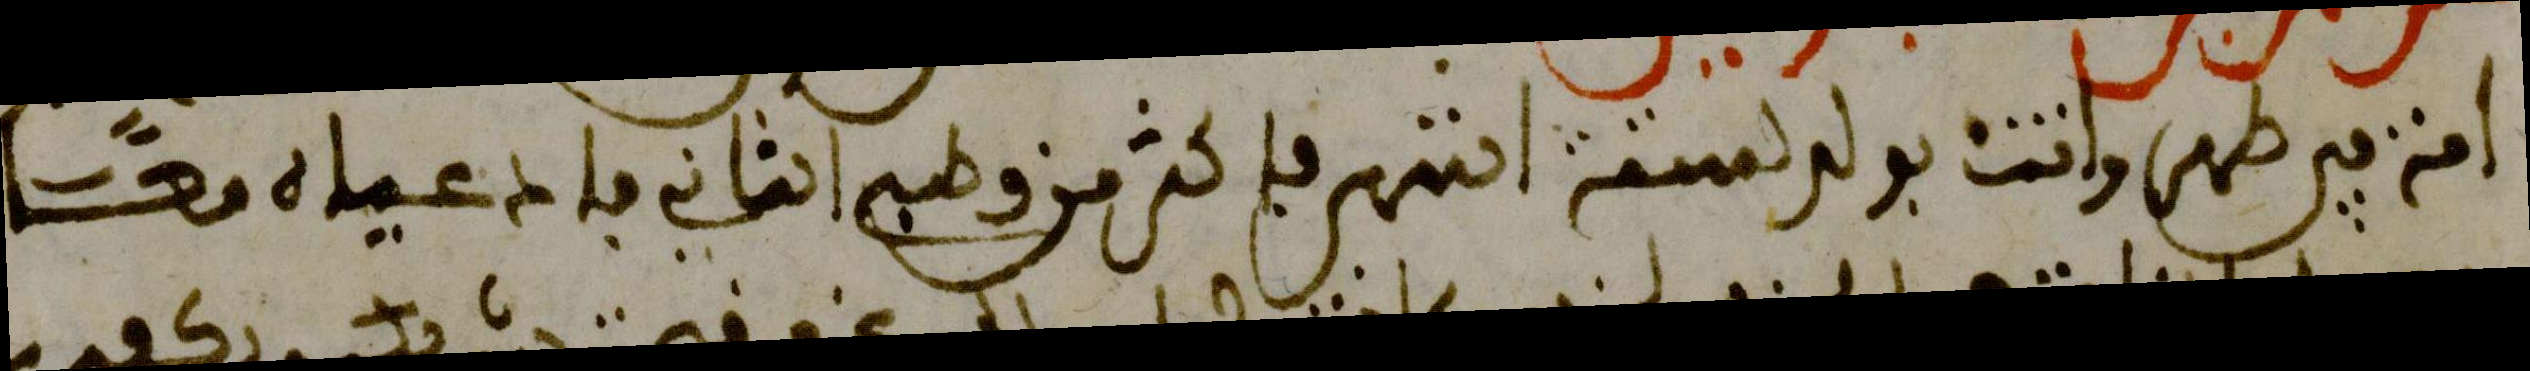امة في طهر واتت بولد لستة اشهر فاكثر من وطئ الثاني فادعياه معًا
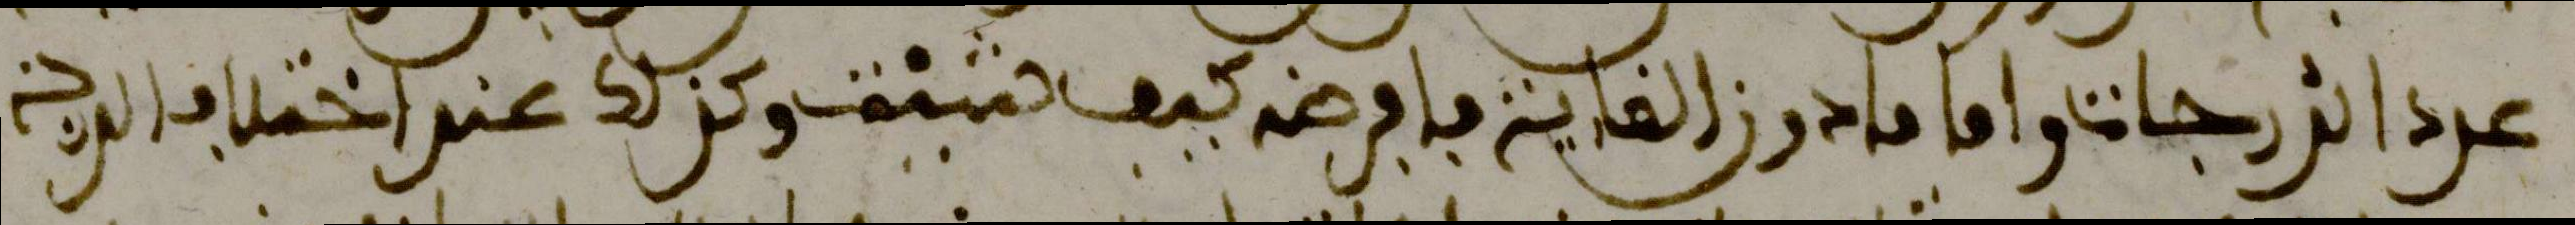عدد الدرجات واما ما دون الغاية فافرضه كيف شئت وكذلك عند اختلاف الدرجة
